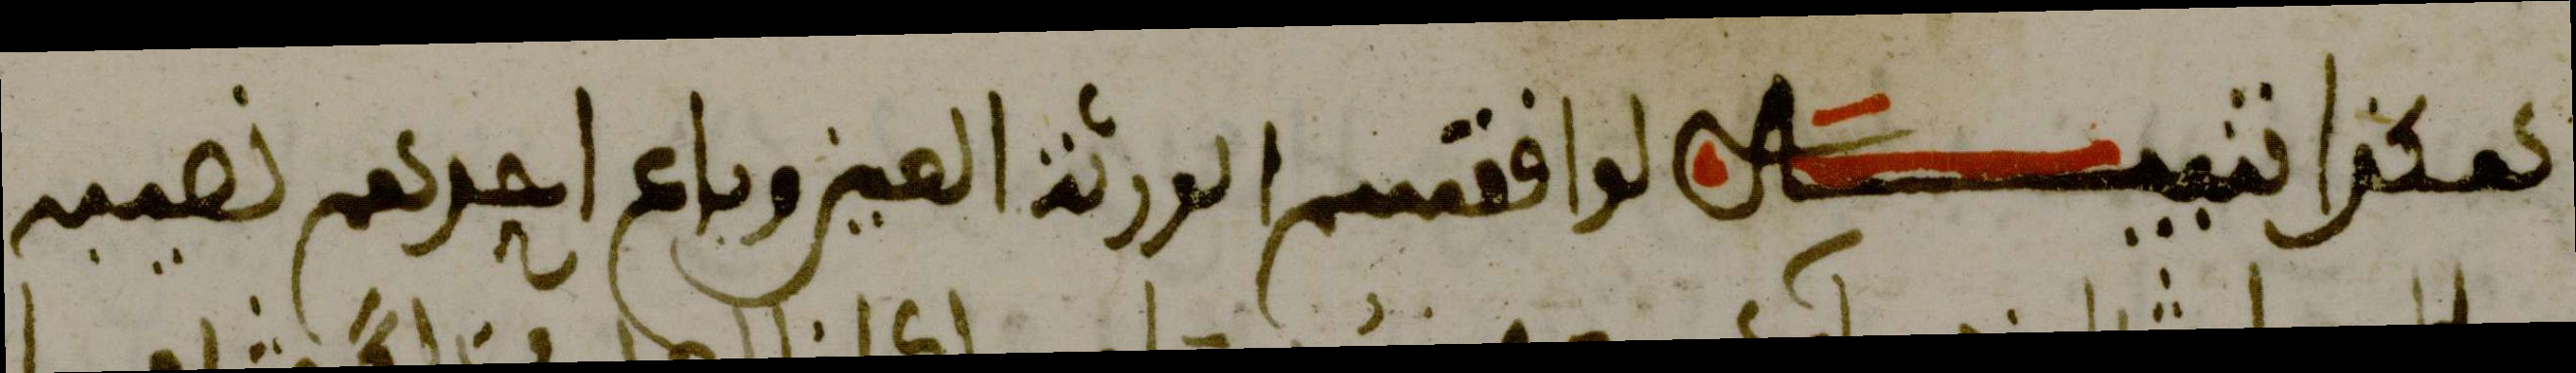هكذا تنبيه او اقتسم الورثة العين وباع احدهم نصيبه
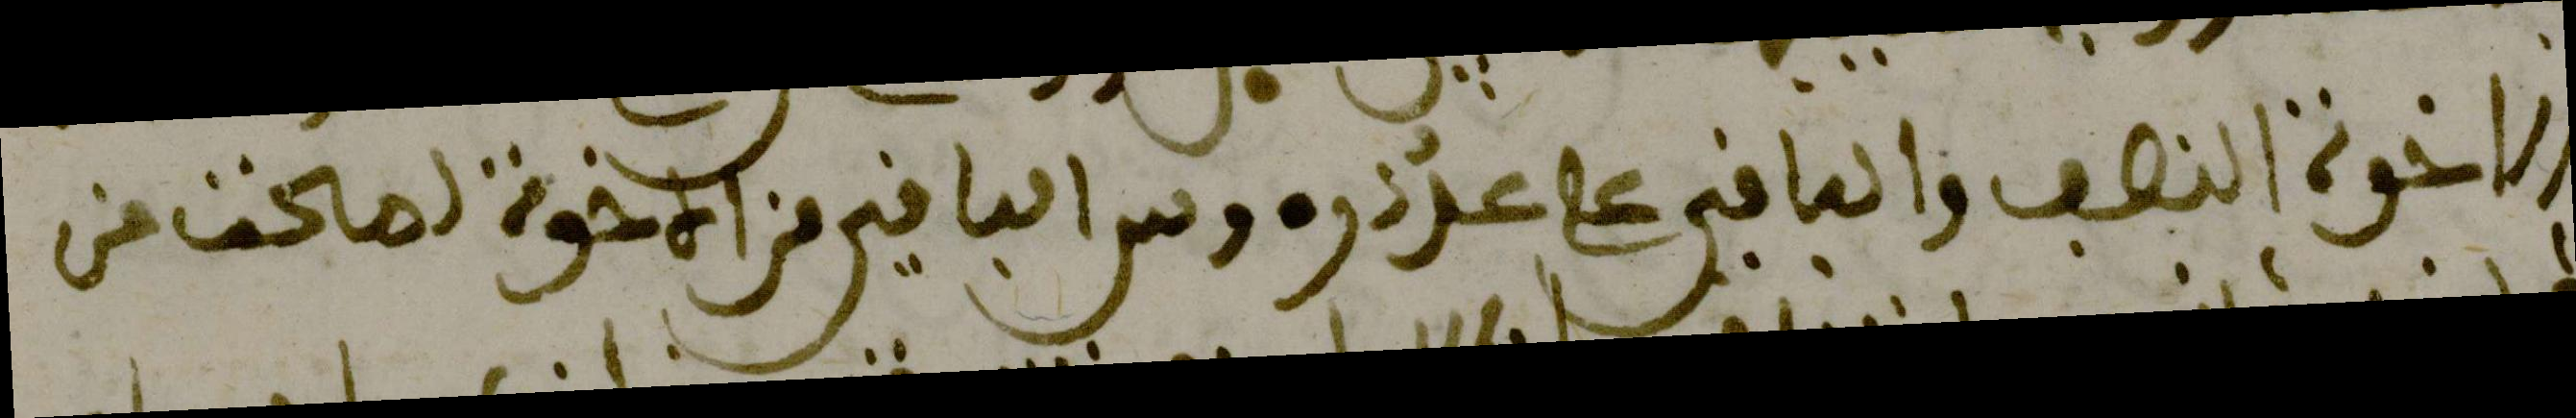الاخوة النصف الباقي على عدد رءوس الباقى من الاخوة لصحت من
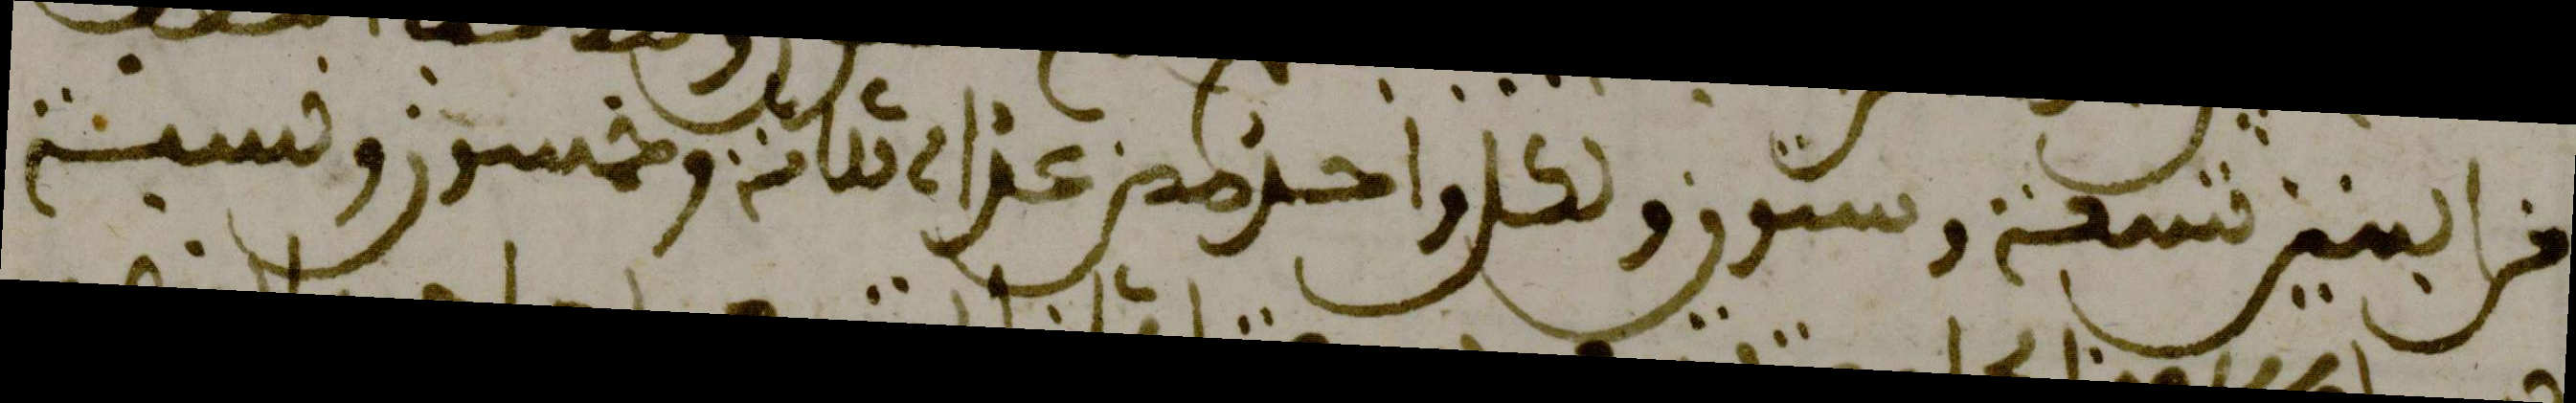من البنين تسعة وستون لكل واحدد ممن عداه ثلاثة وخمسون ونسبة
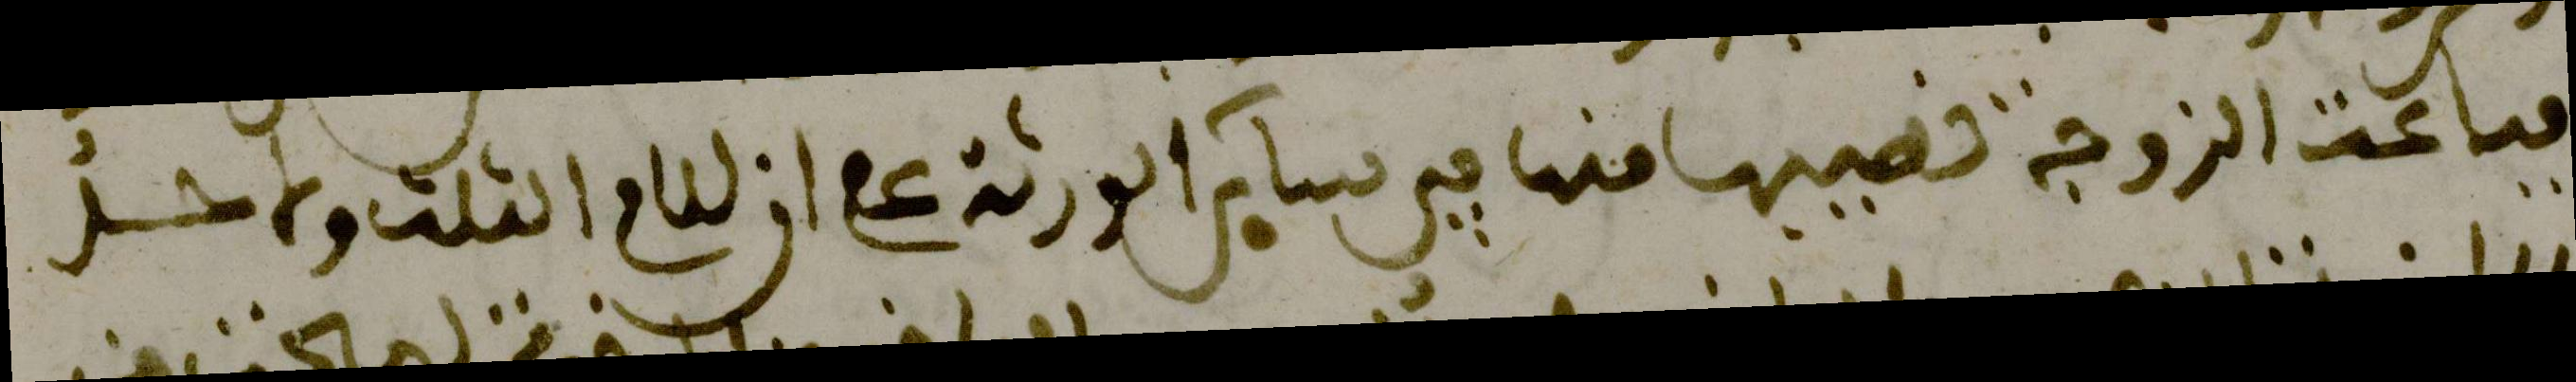فباعت الزوجة نصيبها منها في سائر الورثة على ان للام الثلث ولاحد
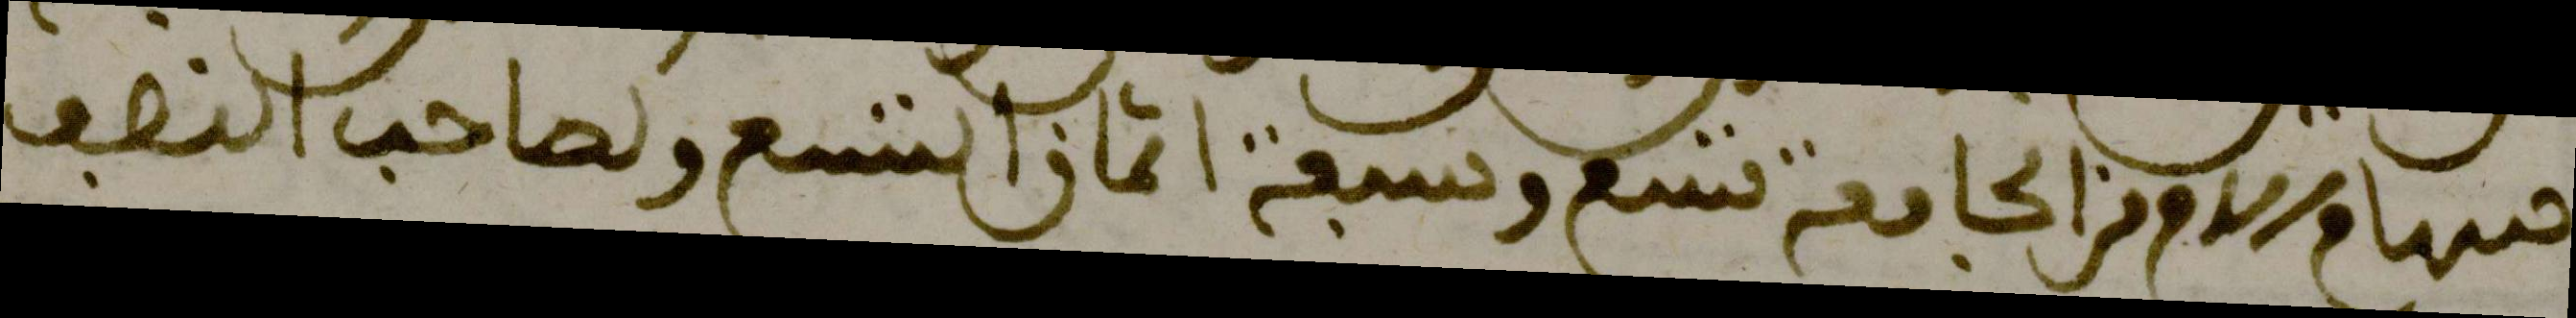سهام الام من الجامعة تسع وسبعة اثمان التسع ولصاحب النصف
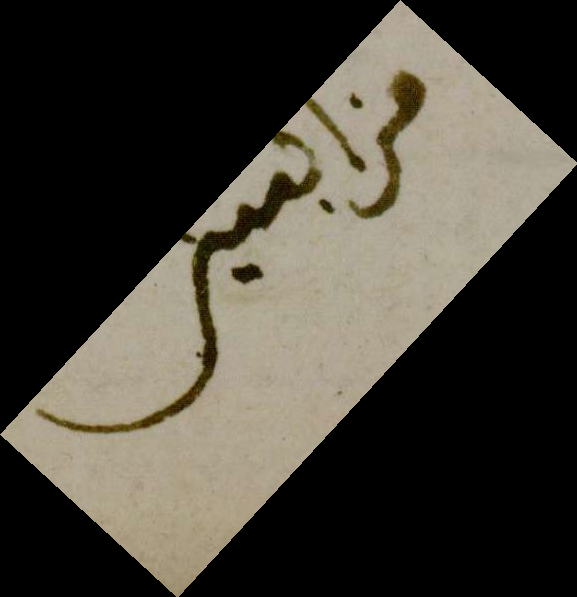من البنين
